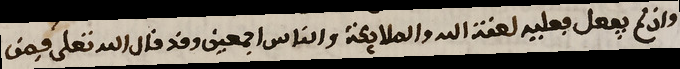واذ لم يفعل فعليه لعنة الله والملائكة والناس اجمعين وقد قال الله تعالى فمن
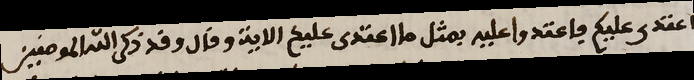اعتدى عليكم فاعتدوا عليه بمثل ما اعتدي عليكم الاية وقال وقد ذكر الله المومنين
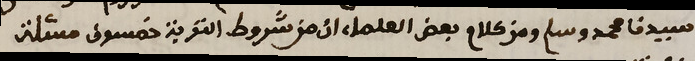سيدنا محمد وسلم ومن كلام بعض العلماء ان من شروط التوبة خمسون مسئلة
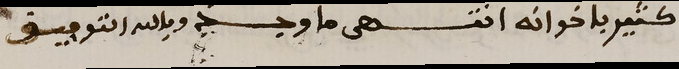كثير باخوانه انتهى ما وجد وبالله التوفيق
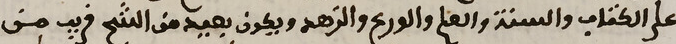على الكتاب والسنة والعلم والورع والزهد ويكون بعيدا من الشح قريب من
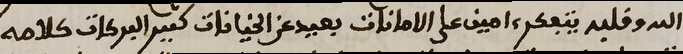الله و قلبه يتفكر امين على الامانات بعيد عن الخيانات كثير البركات كلامه
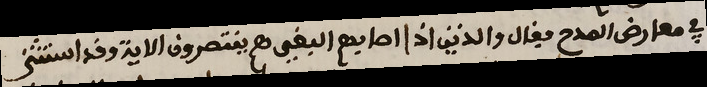في معارض المدح فقال والذين اذا اصابهم البغي هم ينتصرون الاية وقد استثنى
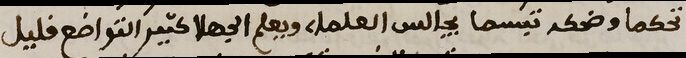تحكما و ضحكه تبسما يجالس العلماء ويعلم الجهلا كثير التواضع قليل
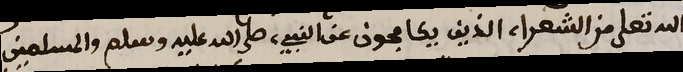الله تعالى من الشعراء الذين يكافحون عن النبي صلى الله عليه وسلم والمسلمين
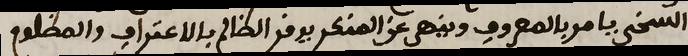السخى يامر بالمعروف وينهى عن المنكر يدفر الظالم بالاعتراف والمظلوم
